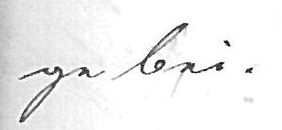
ge bei.
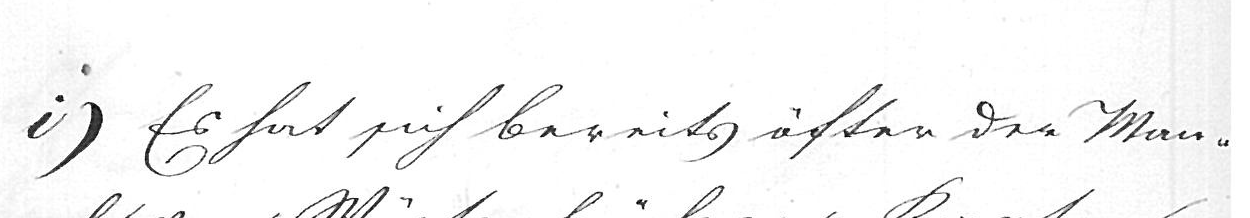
i) Es hat sich bereits öfter der Man-
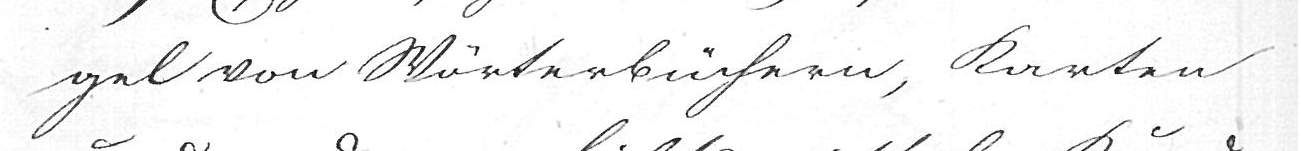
gel von Wörterbüchern, Karten
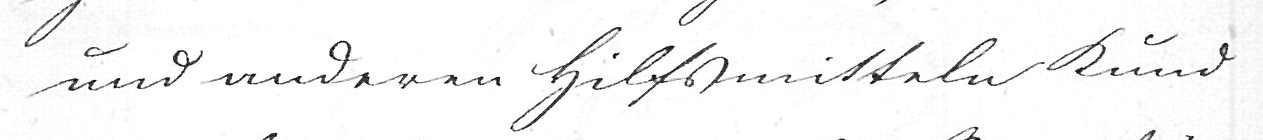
und anderen Hilfsmittteln kund
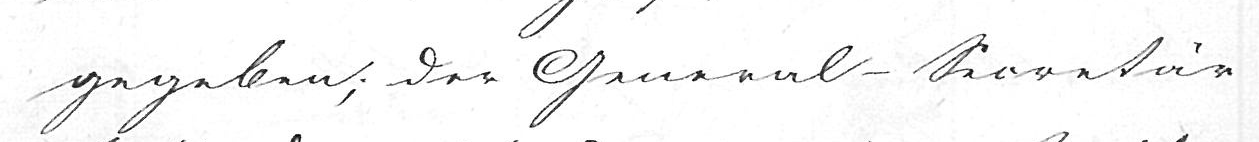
gegeben; der General-Secretär
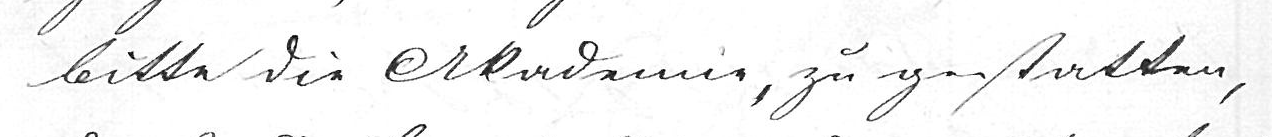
bitte die Akademie, zu gestatten,
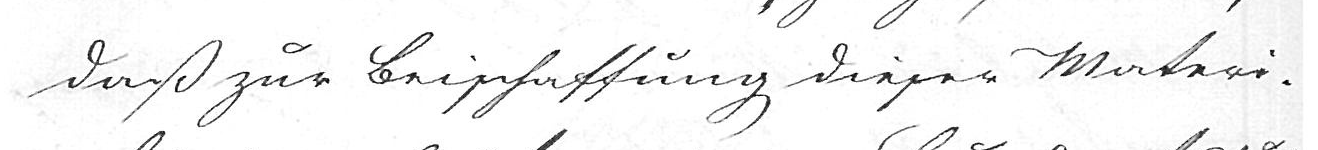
daß zur Beischaffung dieser Materi-
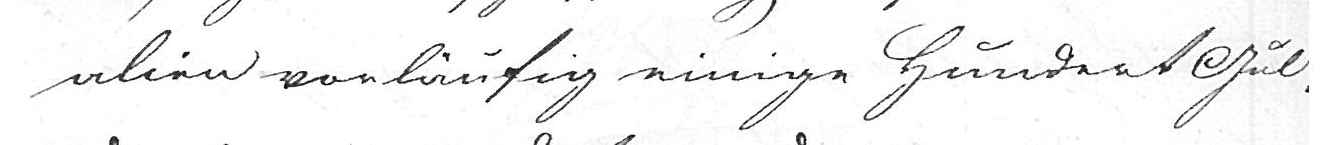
alien vorläufig einige Hundert Gul-
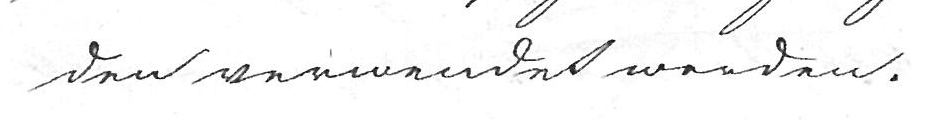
den verwendet werden.
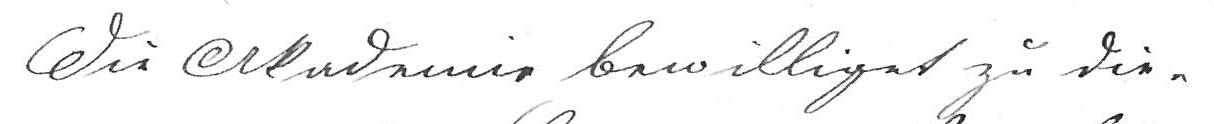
Die Akademie bewilliget ein die-
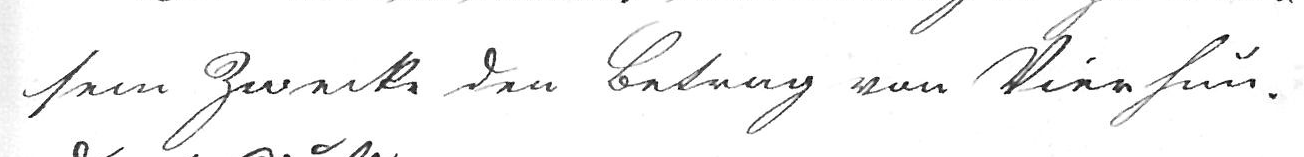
sem Zwecke den Betrag von Vierhun-
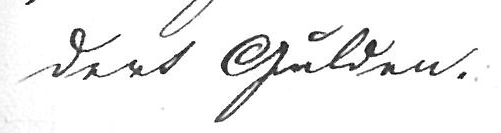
dert Gulden.
